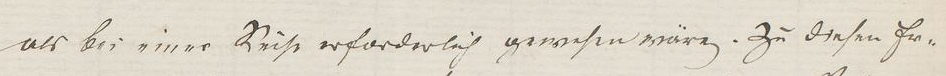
als bei einer Reise erforderlich gewesen wäre. Zu diesen Er-
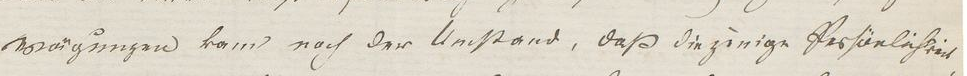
wägungen kam noch der Umstand, daß diejenige Persönlichkeit,
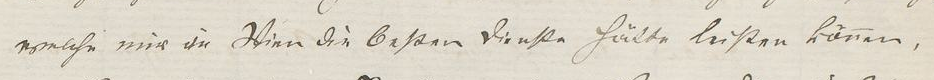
welche mir in Wien die besten Dienste hätte leisten können,
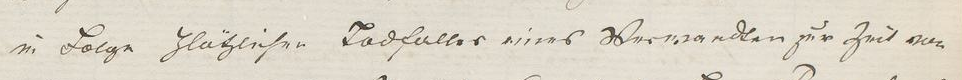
in Folge plötzlichen Todfalles eines Verwandten zur Zeit von
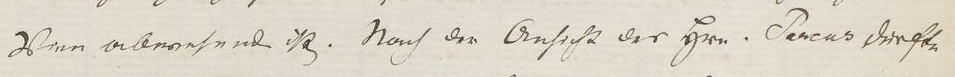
Wien abwesend ist. Nach der Ansicht des Hrn. Parcus dürfte
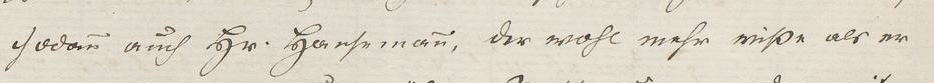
sodann auch Hr. Hansemann, der wohl mehr wiße als er
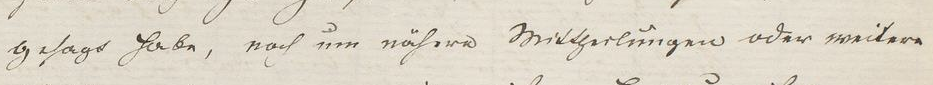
gesagt habe, noch um nähere Mittheilungen oder weitere
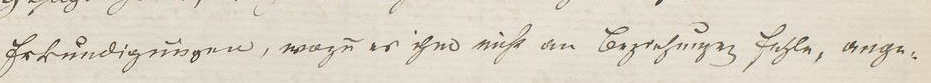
Erkundigungen, wozu es ihm nicht an Beziehungen fehle, ange-
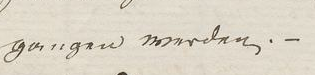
gangen werden. –
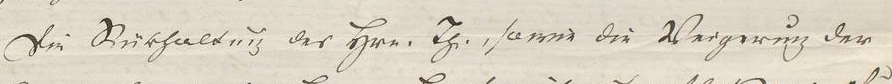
Die Rükhaltung des Hrn. Th., sowie die Weigerung der
